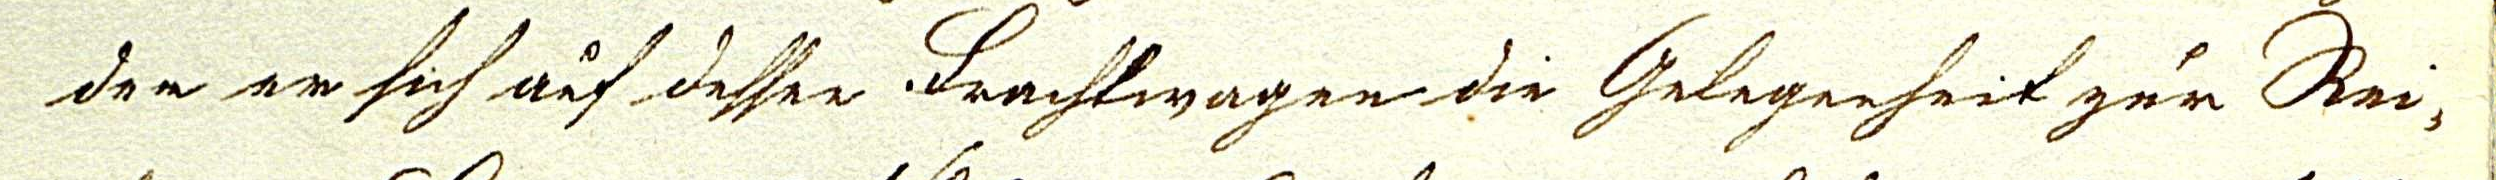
dem er sich auf dessen Frachtwagen die Gelegenheit zur Rei¬
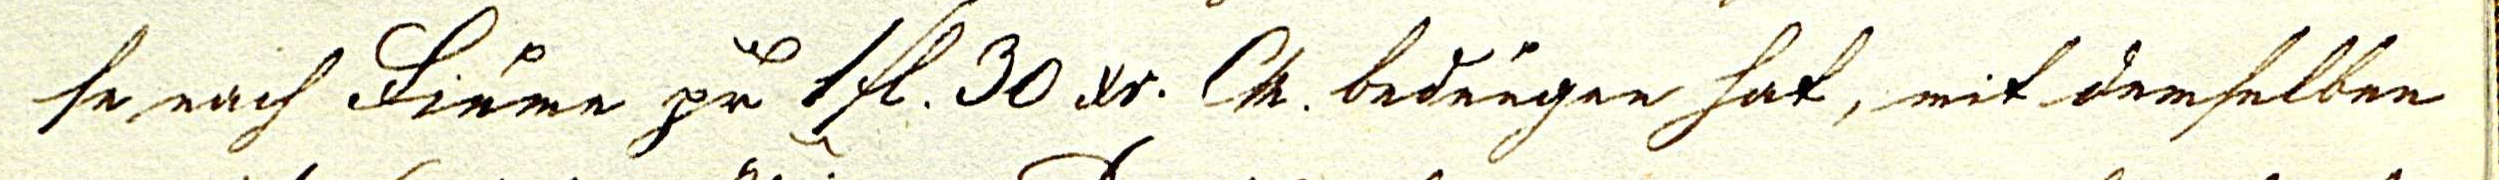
se nach Fiume pr 1 fl 30 xr CM bedungen hat, mit demselben
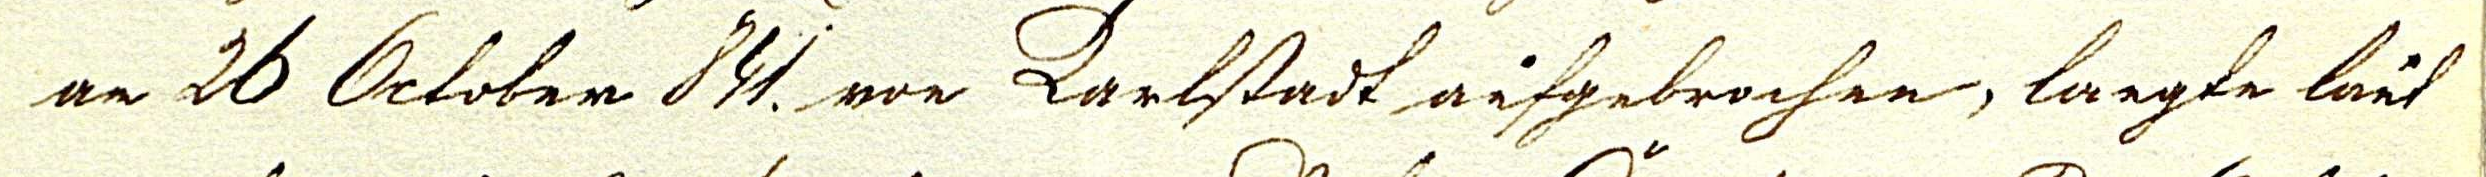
am 26 October 841 von Carlstadt aufgebrochen, langte laut
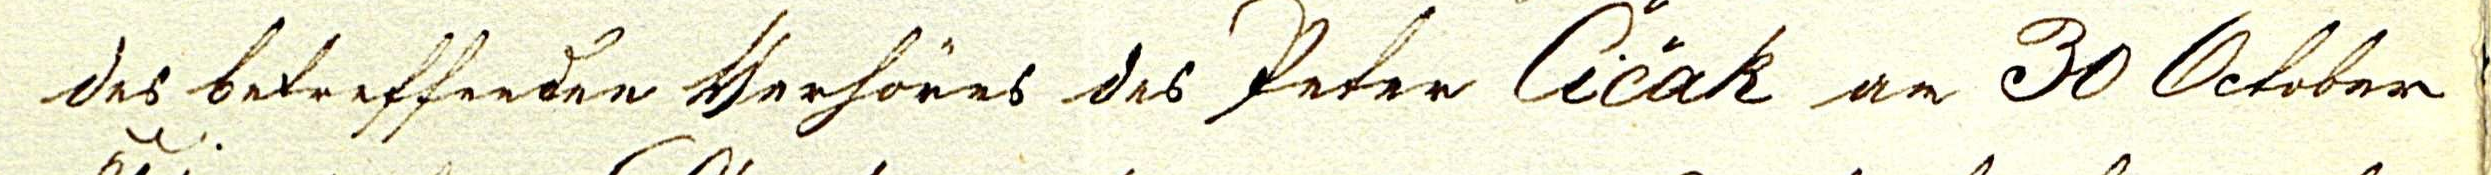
des betreffenden Verhöres des Peter Čičak am 30 October
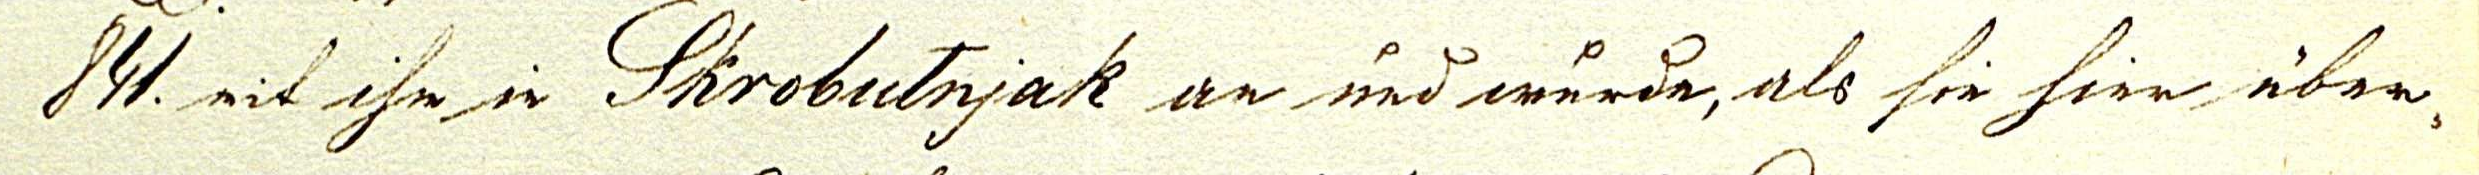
841 mit ihm in Skrobutnjak an und wurde, als sie hier über¬
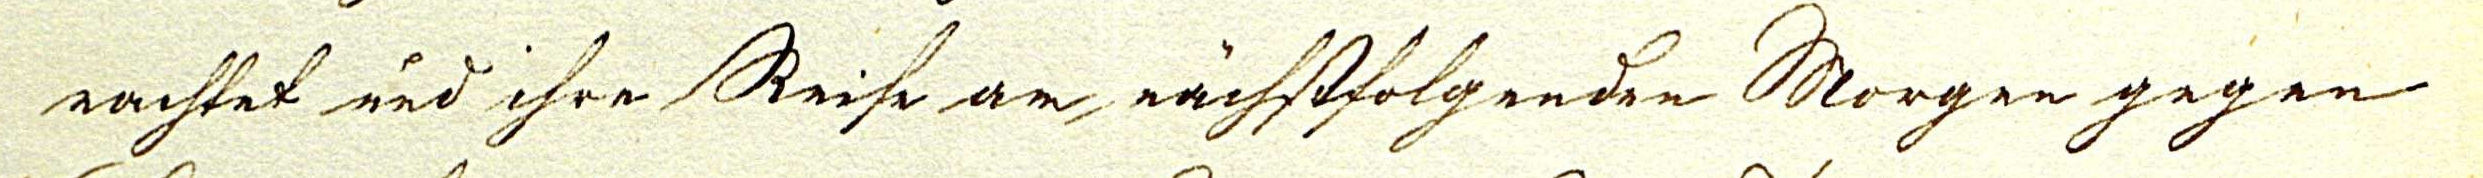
nachtet und ihre Reise am nächstfolgenden Morgen gegen
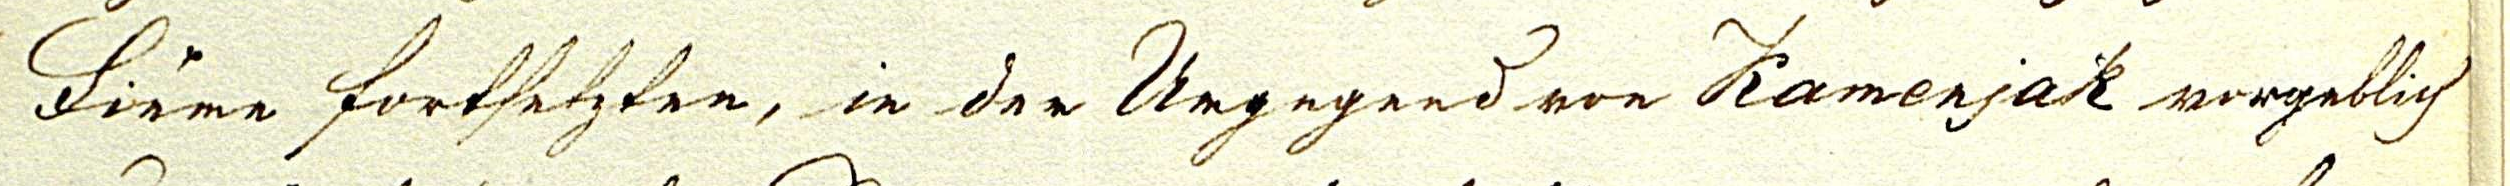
Fiume fortsetzten, in der Umgegend von Kamenjak vorgeblich
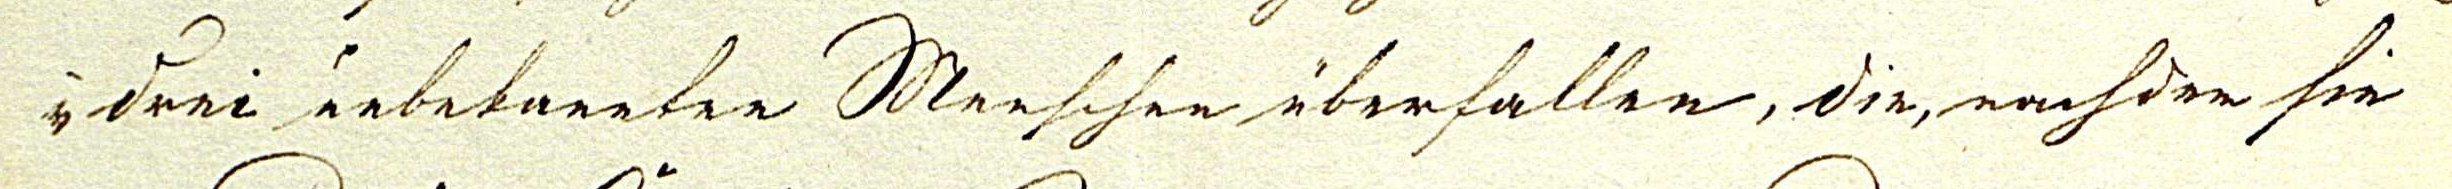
v. drei unbekannten Menschen überfallen, die, nachdem sie
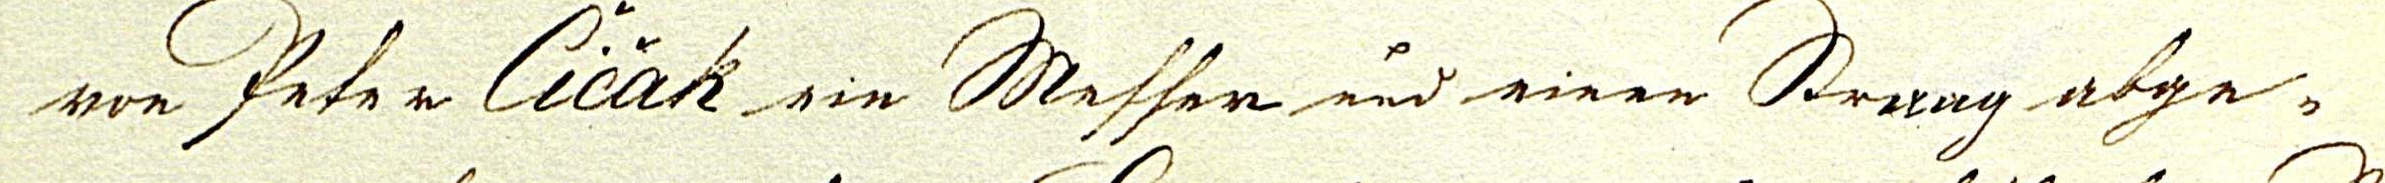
von Peter Čičak ein Messer und einen Strang abge¬
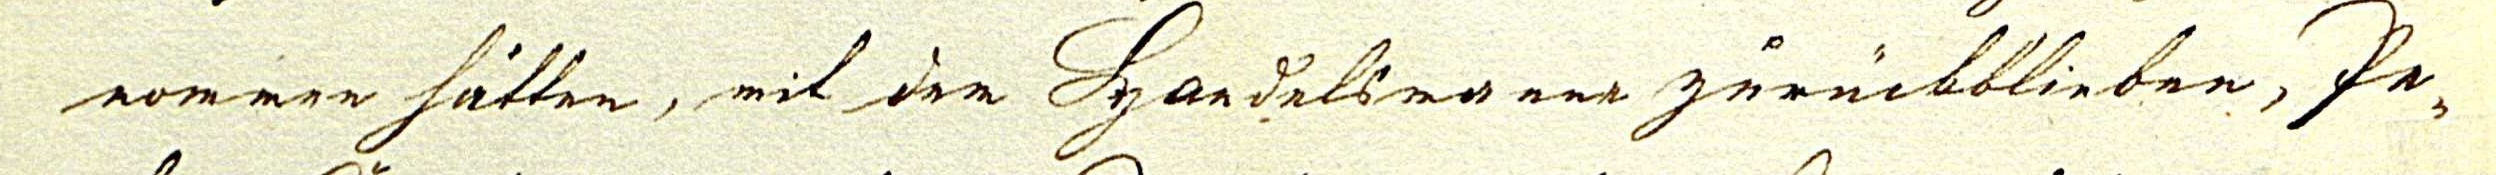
nommen hätten, mit dem Handelsmanne zurückblieben, Pe¬
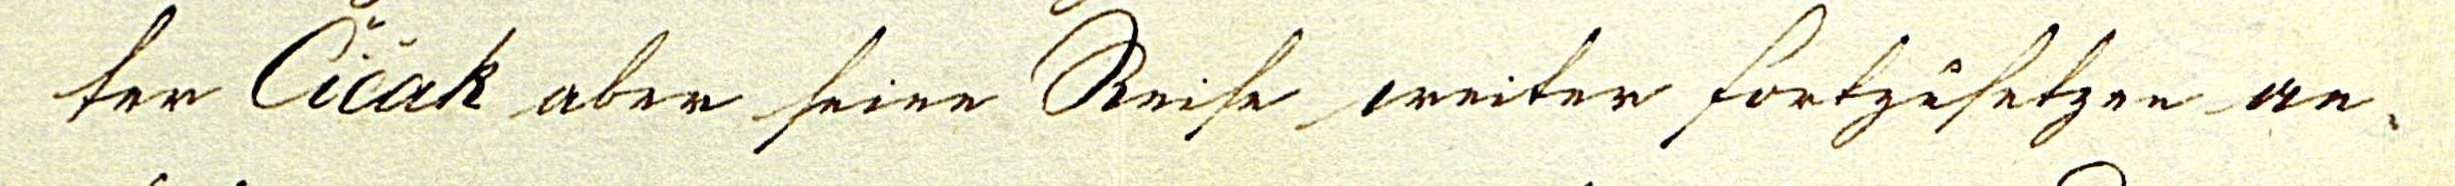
ter Čičak aber seine Reise, weiter fortgesetzen an¬
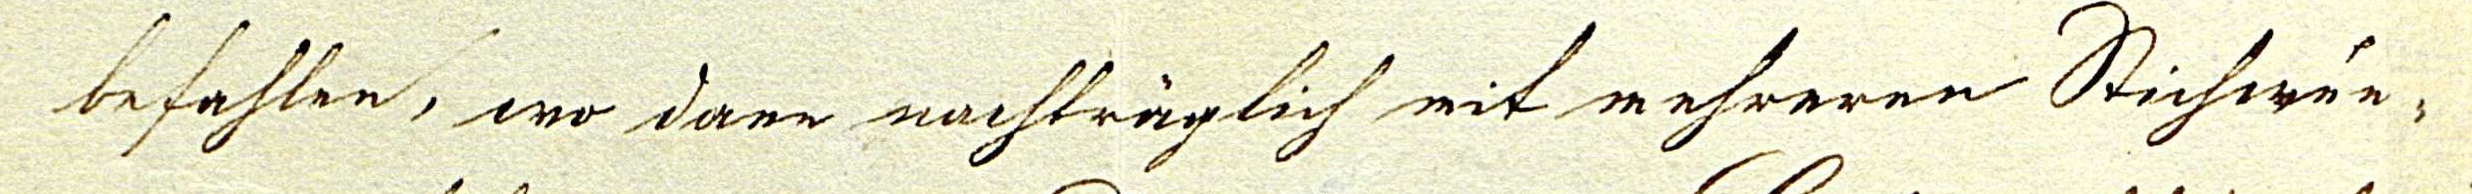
befahlen, wo dann nachträglich mit mehreren Stichwun¬
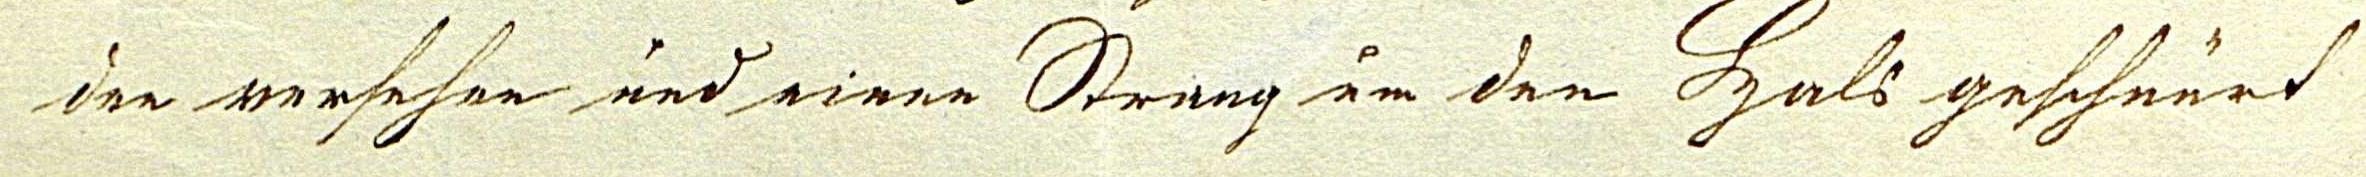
den versehen und einen Strang an den Hals geschnürt
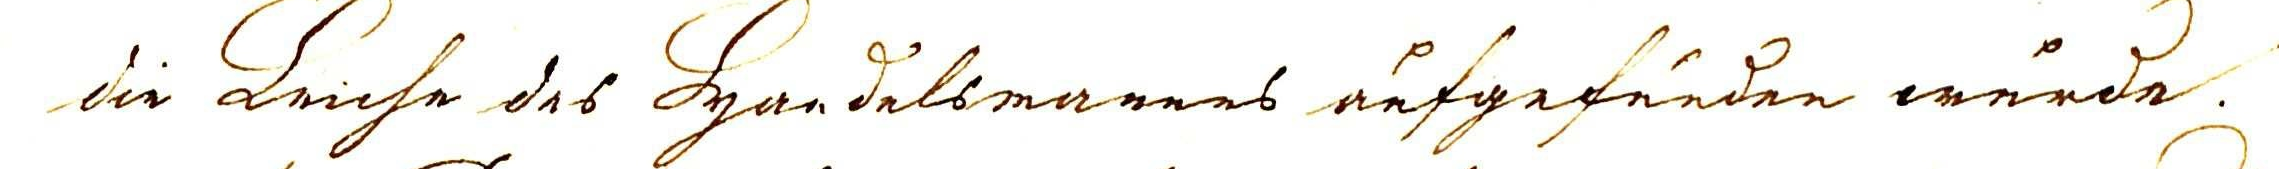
die Leiche des Handelsmannes aufgefunden wurde.
